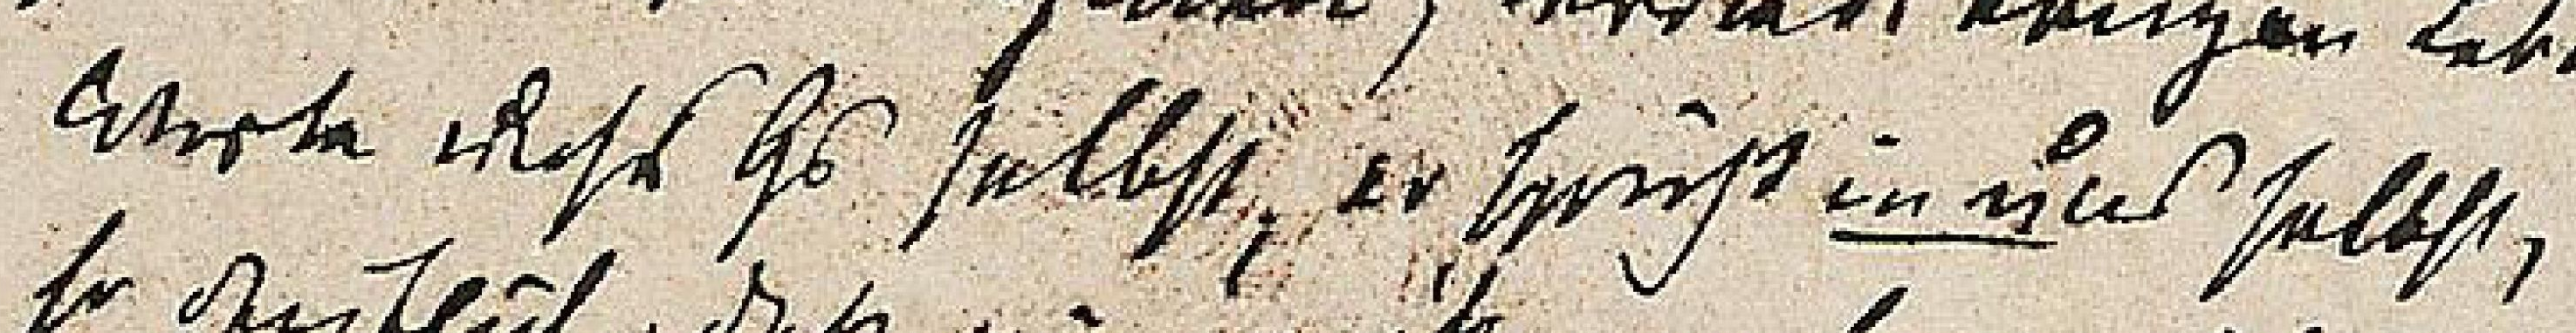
Worten unsrs Gs selbst, er spricht in uns selbst,
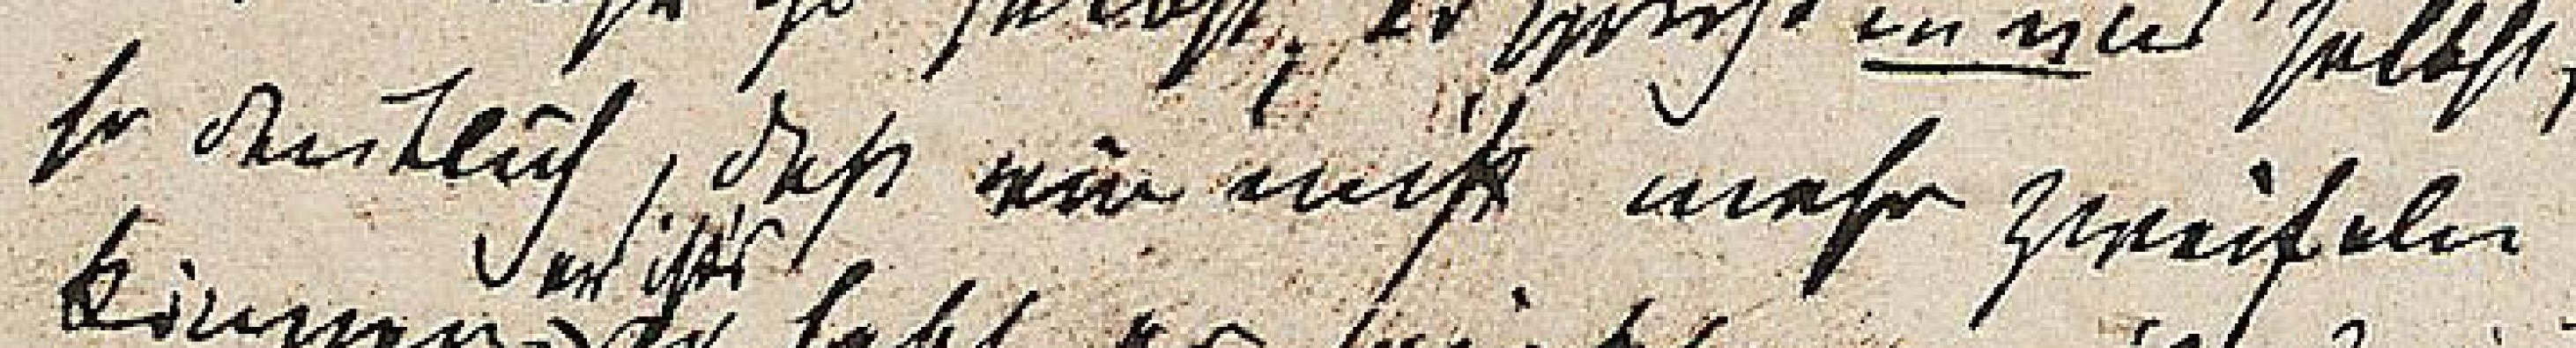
so deutlich, daß wir nicht mehr zweifeln
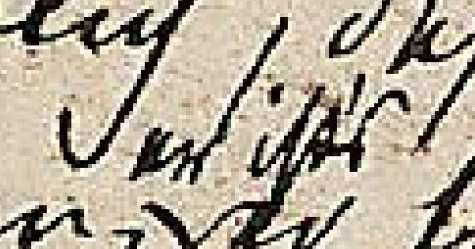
er ist's
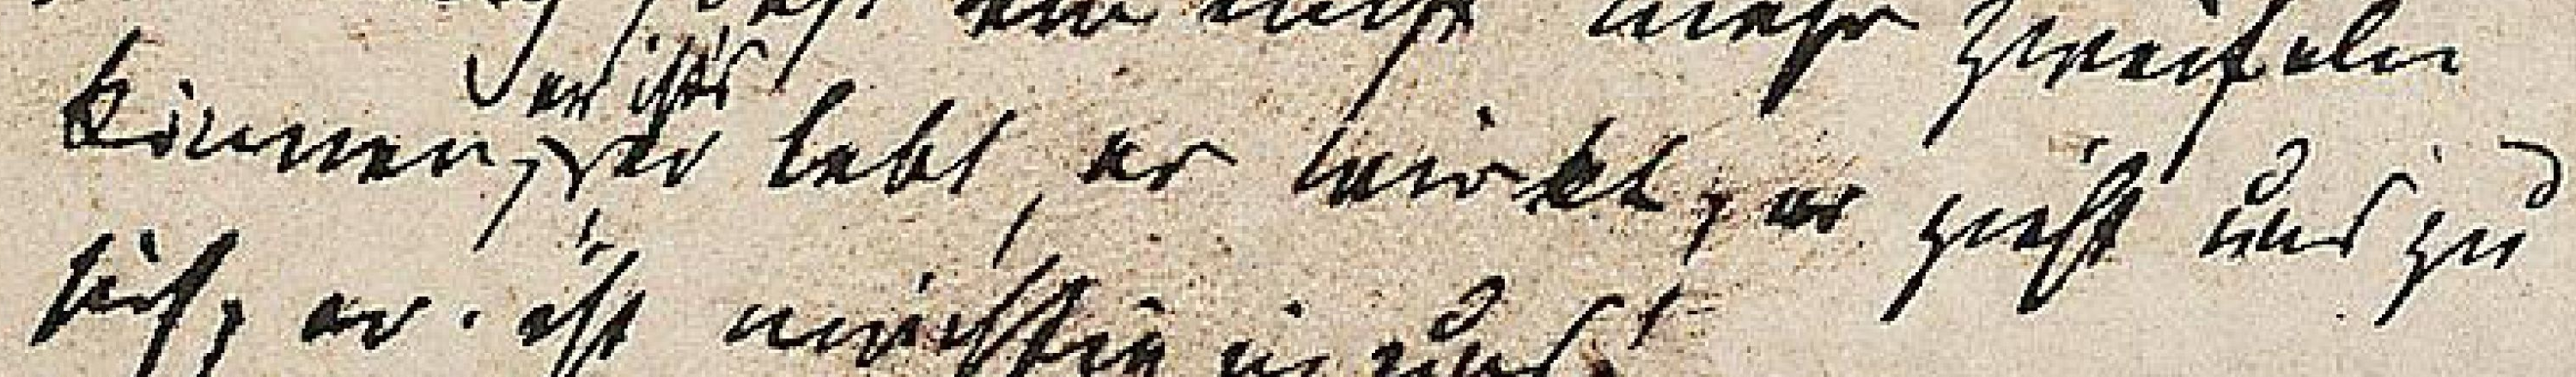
können, er lebt, er wirkt, er zieht uns zu
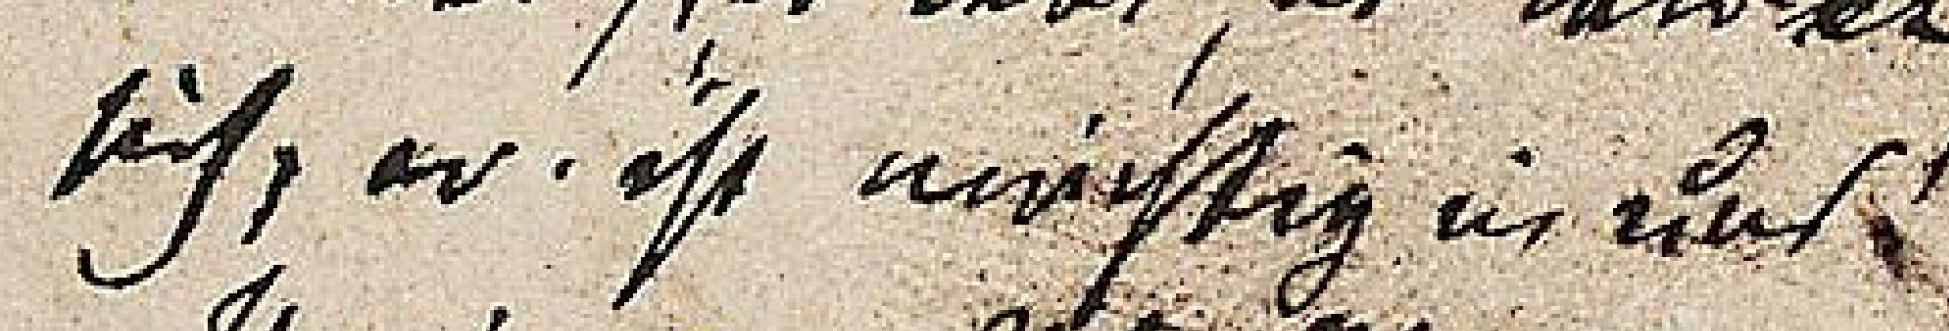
sich, er ist mächtig in uns!
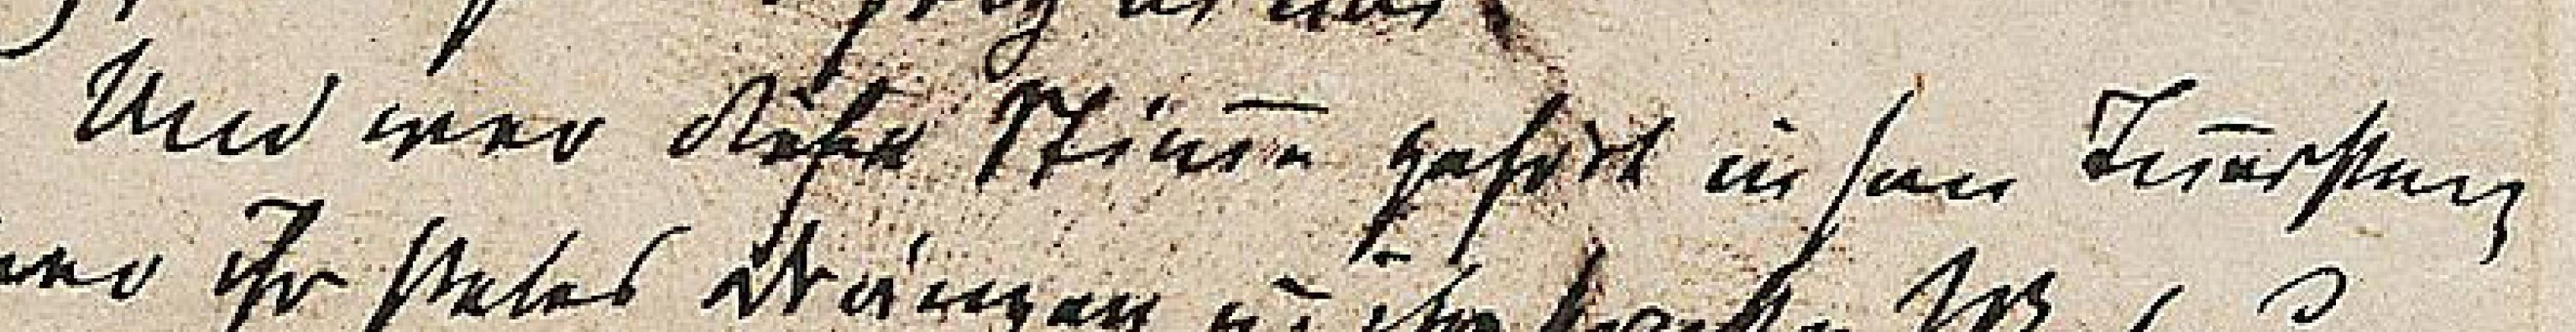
Und wer diese Stimme gehört in snm Inersten,
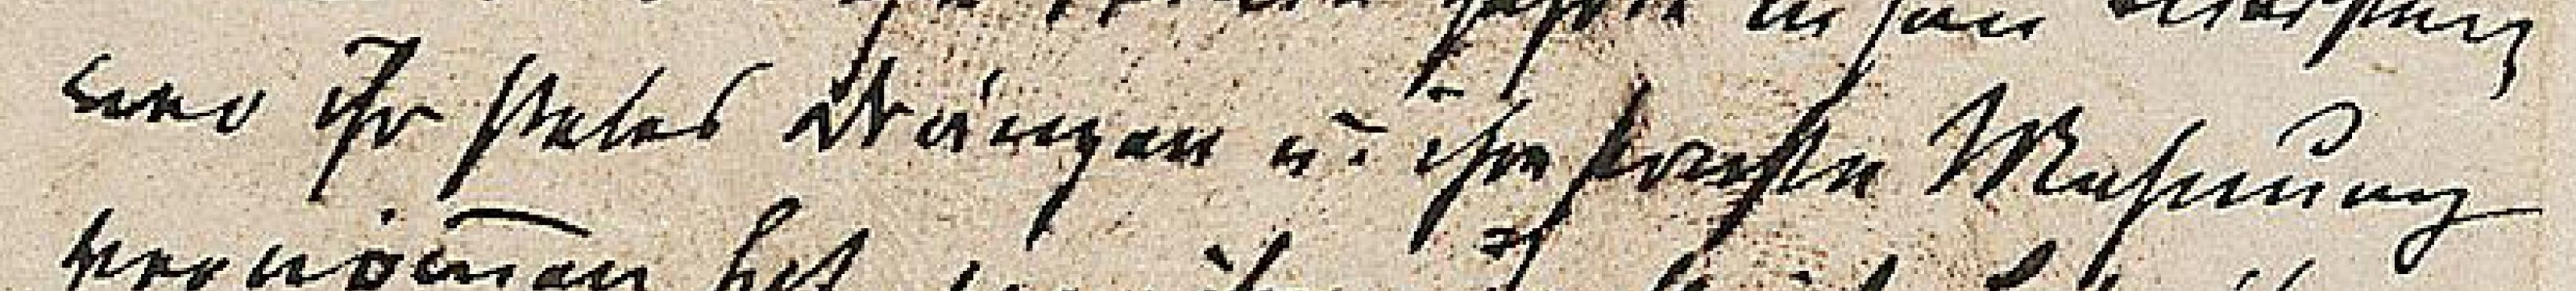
wer ihr stetes Drängen u. ihe sanfte Mahnung
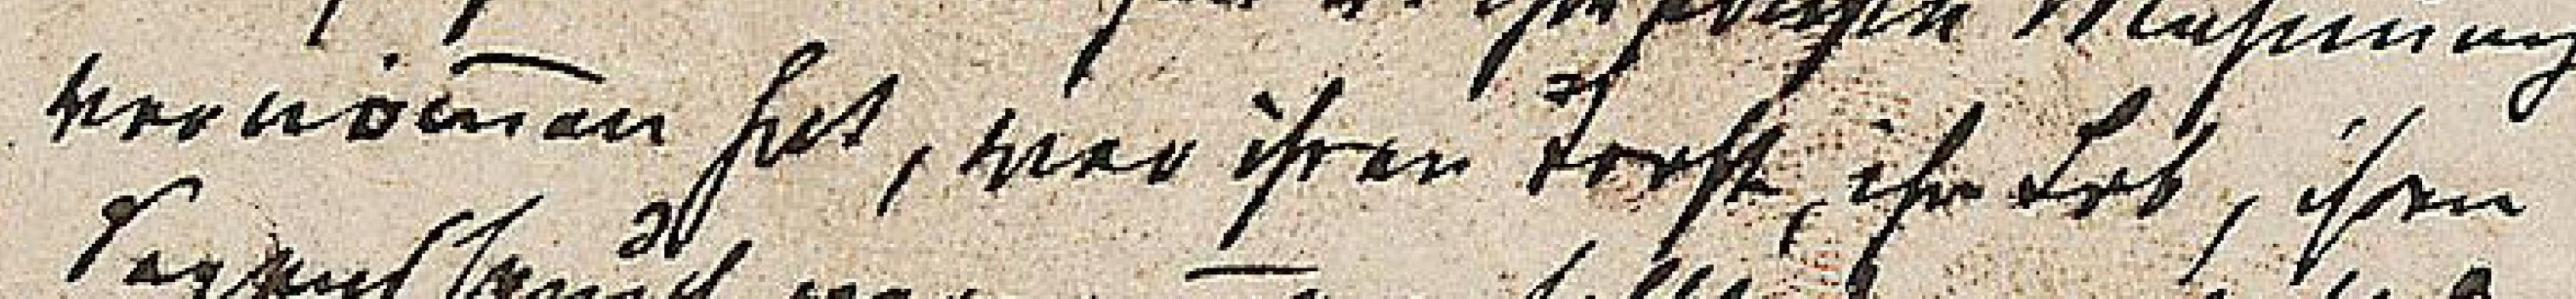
vernomen hat, wer ihren Trost, ihr Lob, ihren
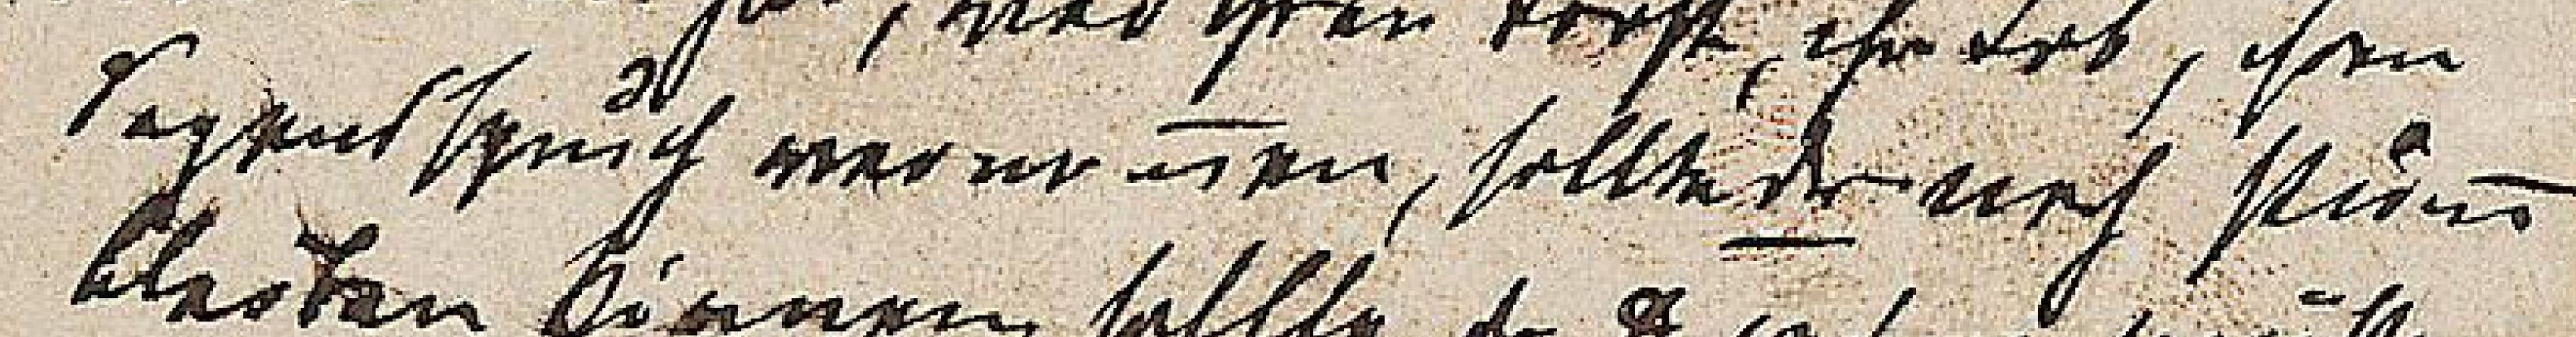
Segensspruch vernomen, sollte dr noch stum
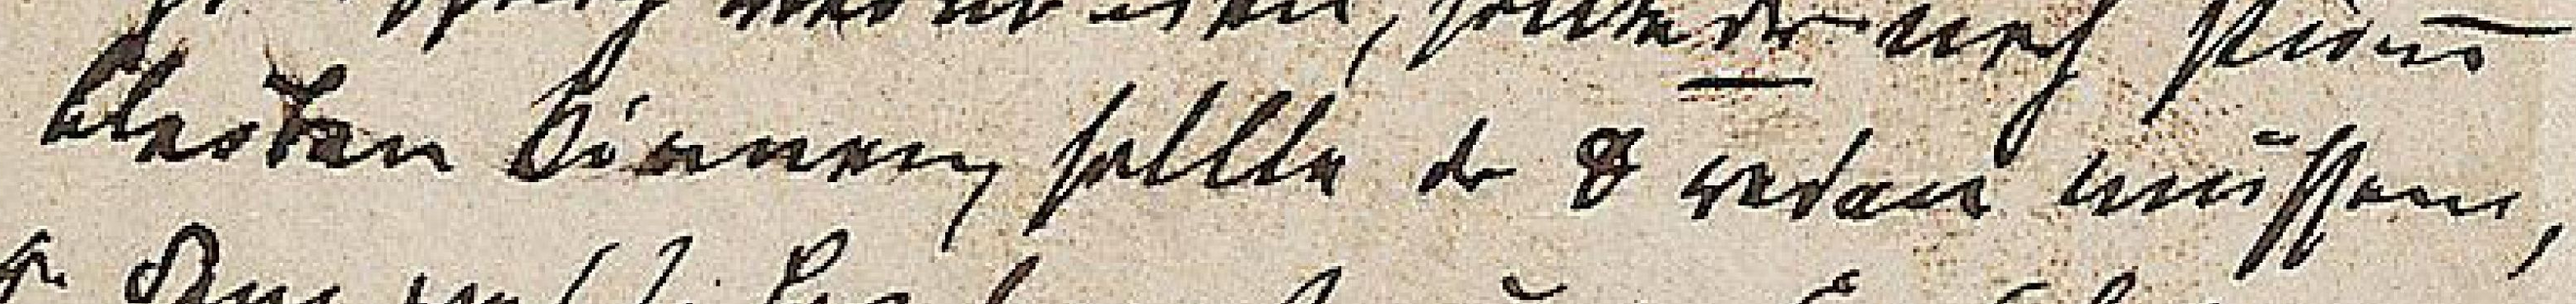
bleiben können, sollte dr o reden müssen,
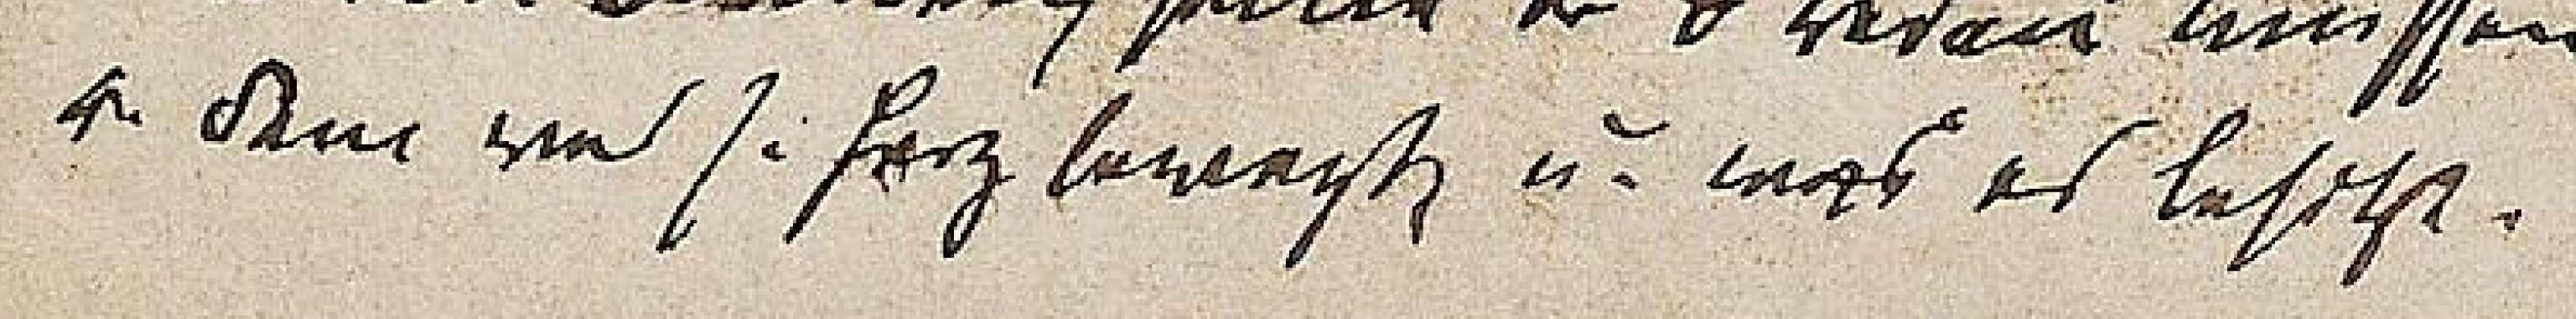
v. dem was s Herz bewegt u. was es besitzt.
